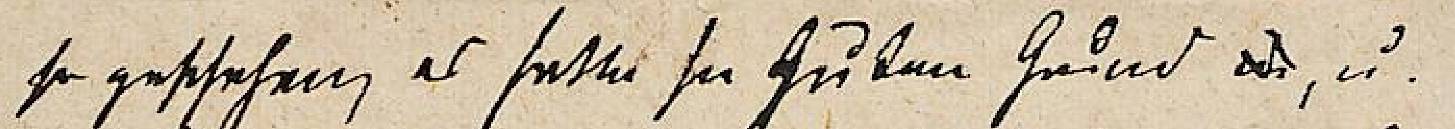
so geschehen, es hatte sn Guten Grund in, u.
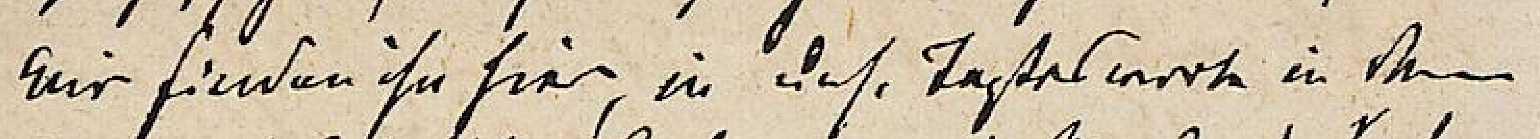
wir finden ihn hier, in uns. Textesworte in dem
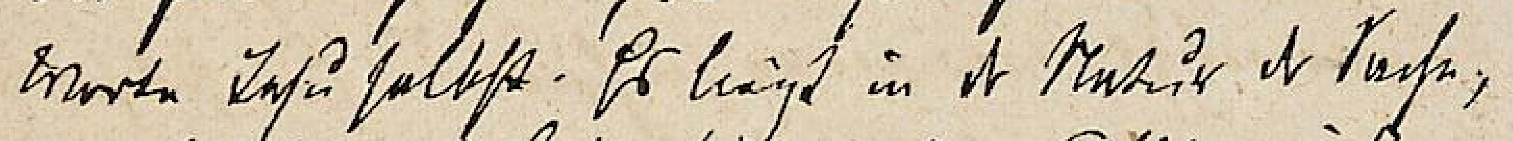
Worte Jesu selbst. Es liegt in dr Natur dr Sache,
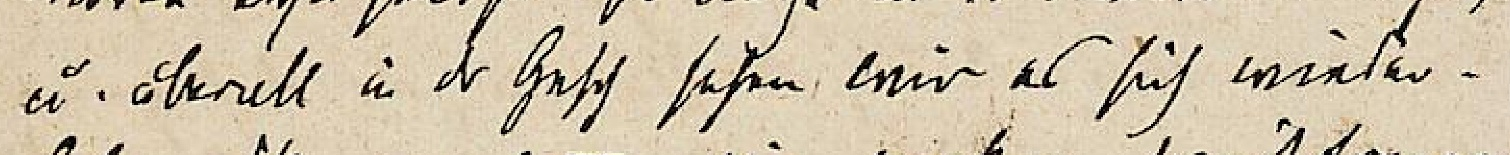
u. überall in der Gesch sehen wir es sich wieder¬
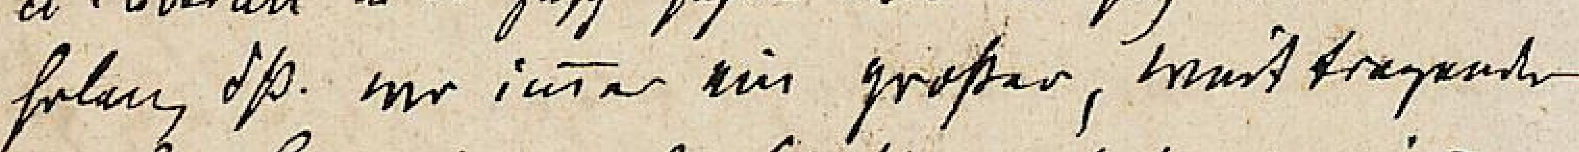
holen, dß wo imer ein großer, weittragender
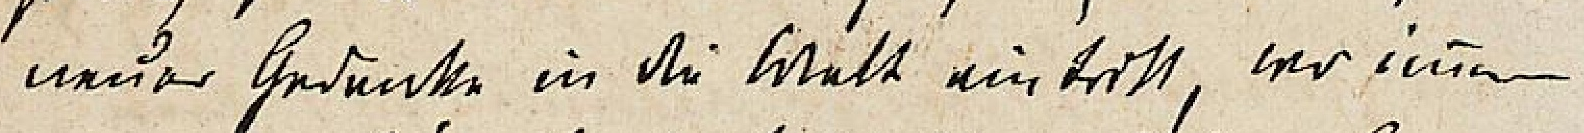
neuer Gedanke in die Welt eintritt, wo imer
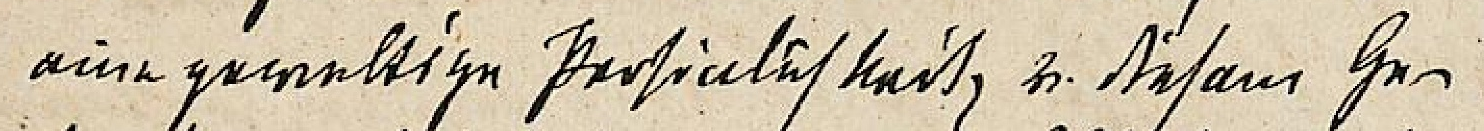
eine gewaltige Persönlichkeit, v diesem Ge¬
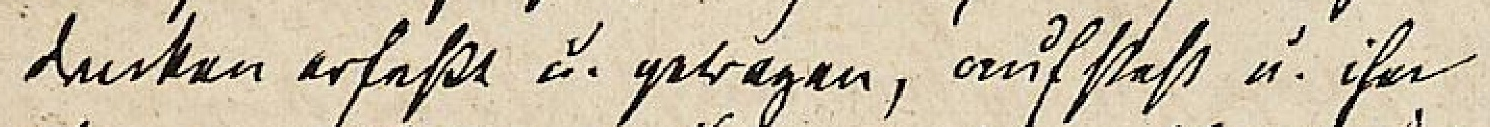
danken erfaßt u getragen, aufsteht u. ihn
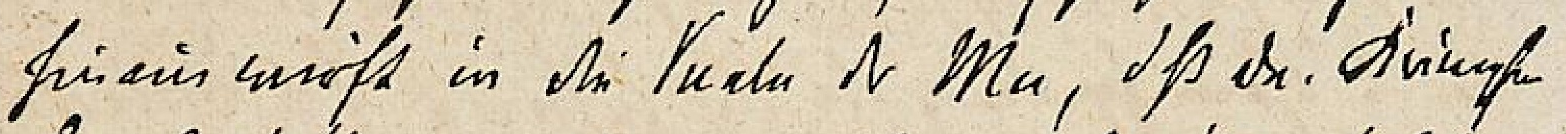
hineinwirft in die Seele dr Mn, dß da Kämpfe
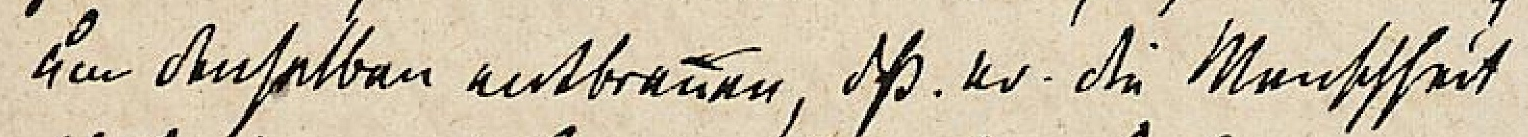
um denselben entbrenen, daß er die Menschheit
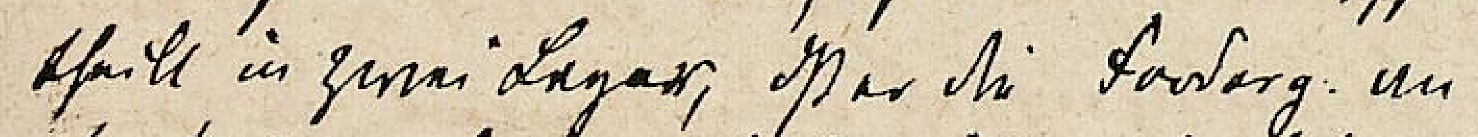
theilt in zwei Lager, dß er die Forderg an
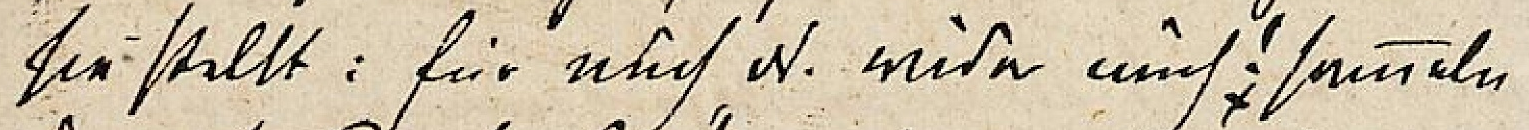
sie stellt: für mich od. wider mich! sameln
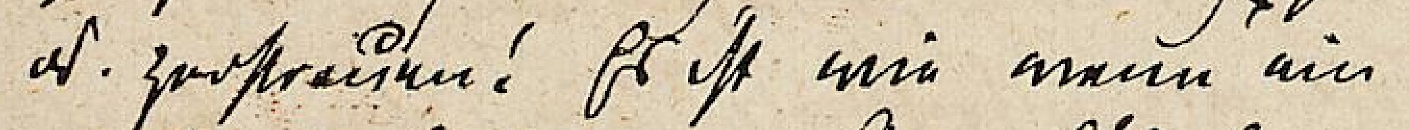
od. zerstreuen! Es ist wie wenn ein
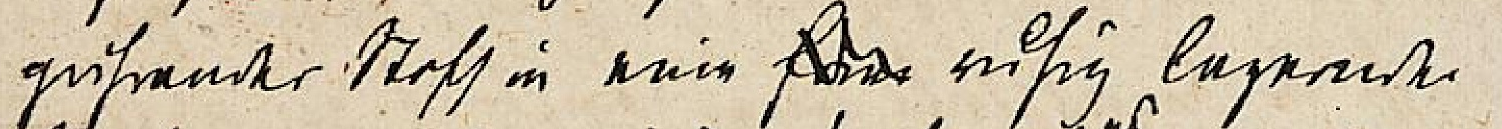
gährender Stoff in eine for ruhig lagernde
